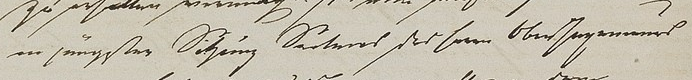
in jüngster Sitzung Seitens des Herrn OberIngeneurs
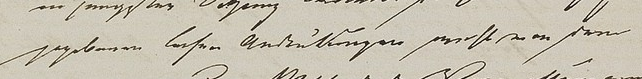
gegebenen leisen Andeutungen wohl von dem
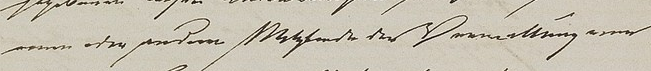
einen oder andern Mitgliede der Verwaltung eine
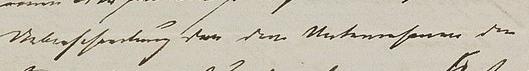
Ueberschreitung der dem Unternehmen der
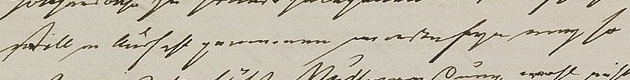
still in Aussicht genommen worden seyn mag so
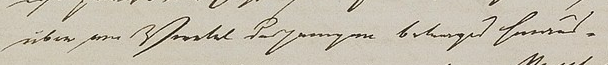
über ein Viertel des ganzen Betrages hinaus-
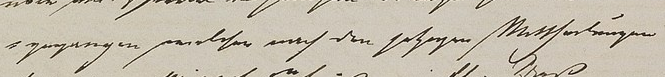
gegangen welcher nach den jetzigen Mittheilungen
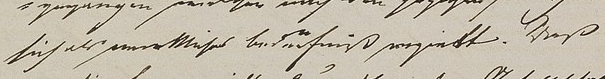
sich als wirkliches Bedürfniß ergiebt. Daß
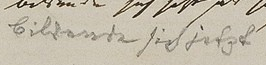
bildende sich jetzt
